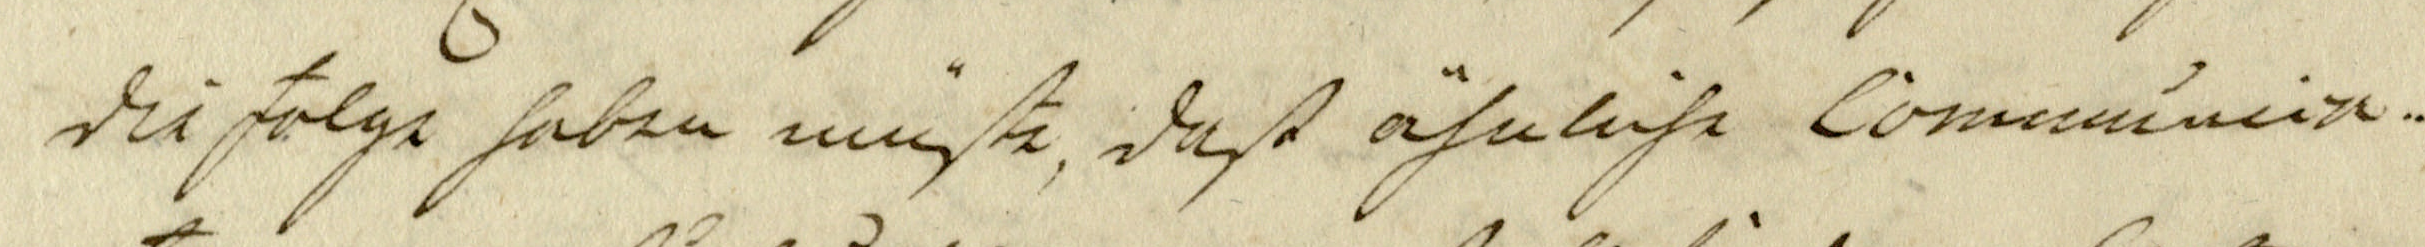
die Folge haben müßte, daß ähnliche Communica¬
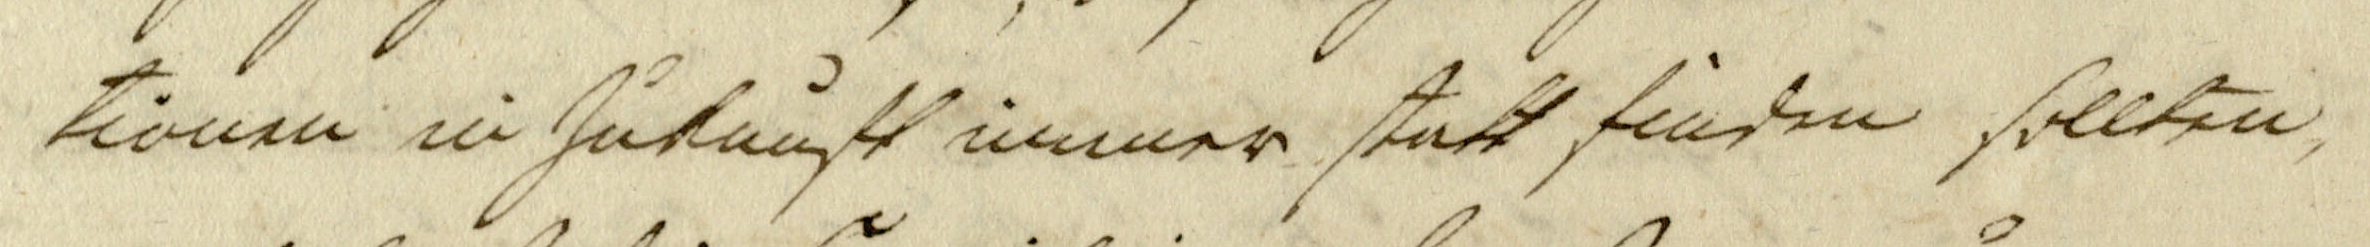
tionen in Zukunft immer statt finden sollten,
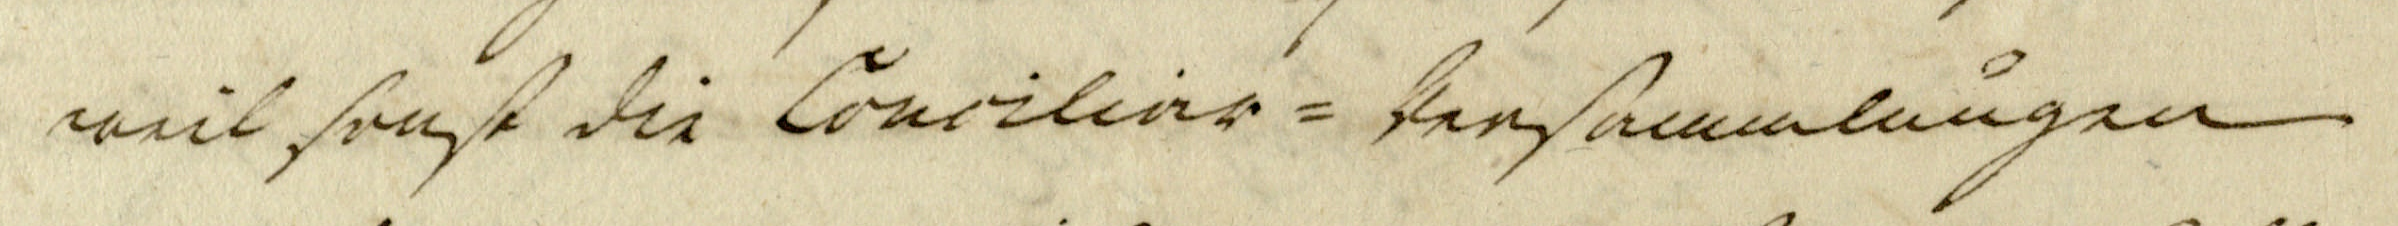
weil sonst die Conciliar- Versammlungen
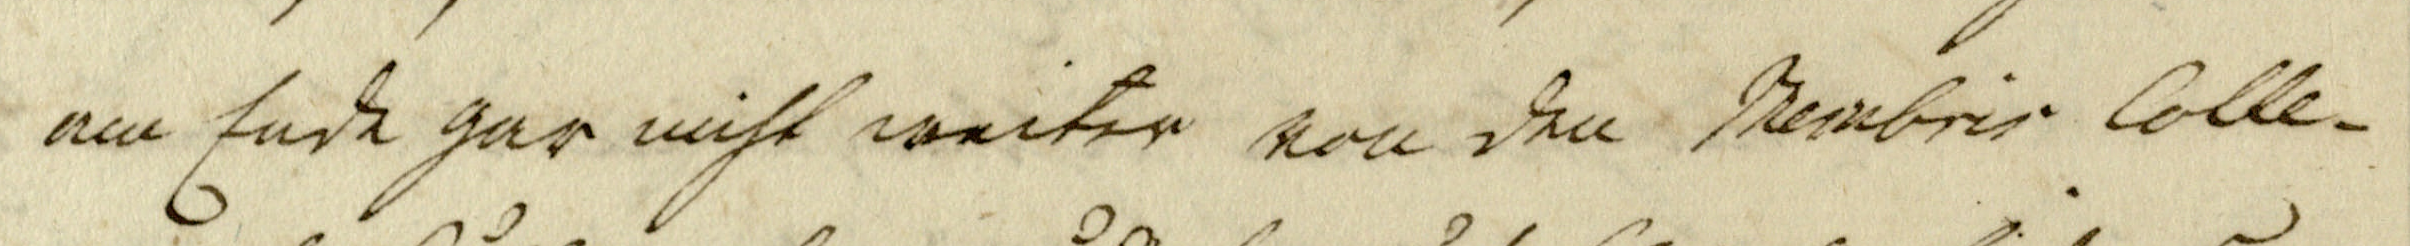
am Ende gar nicht weiter von den Membris Colle¬
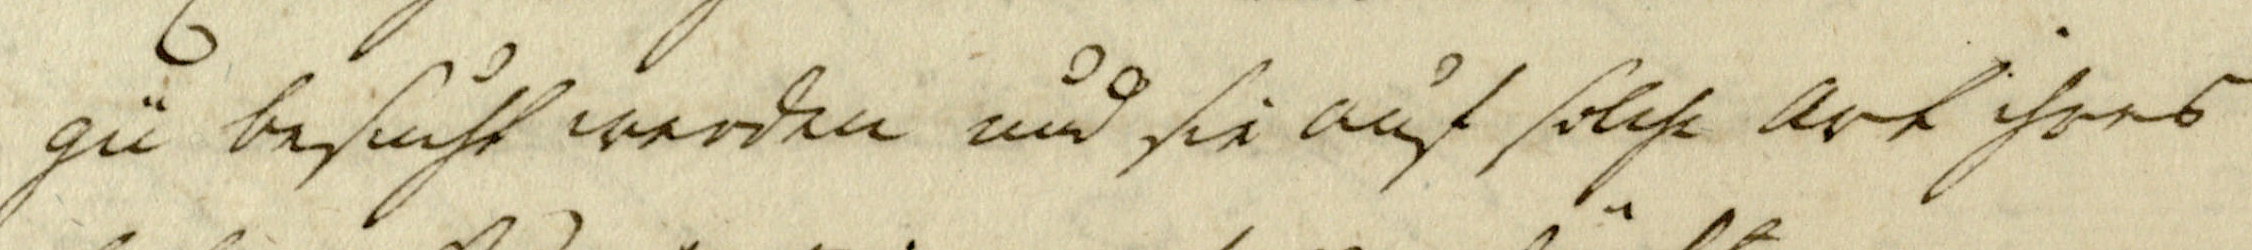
gii besucht werden und sie auf solche Art ihres
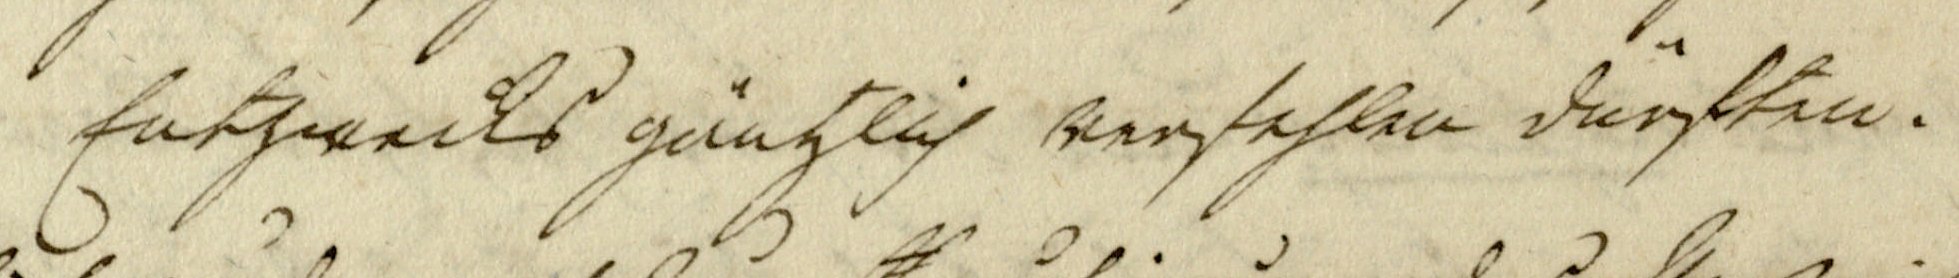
Entzwecks gäntzlich verfehlen dürften.
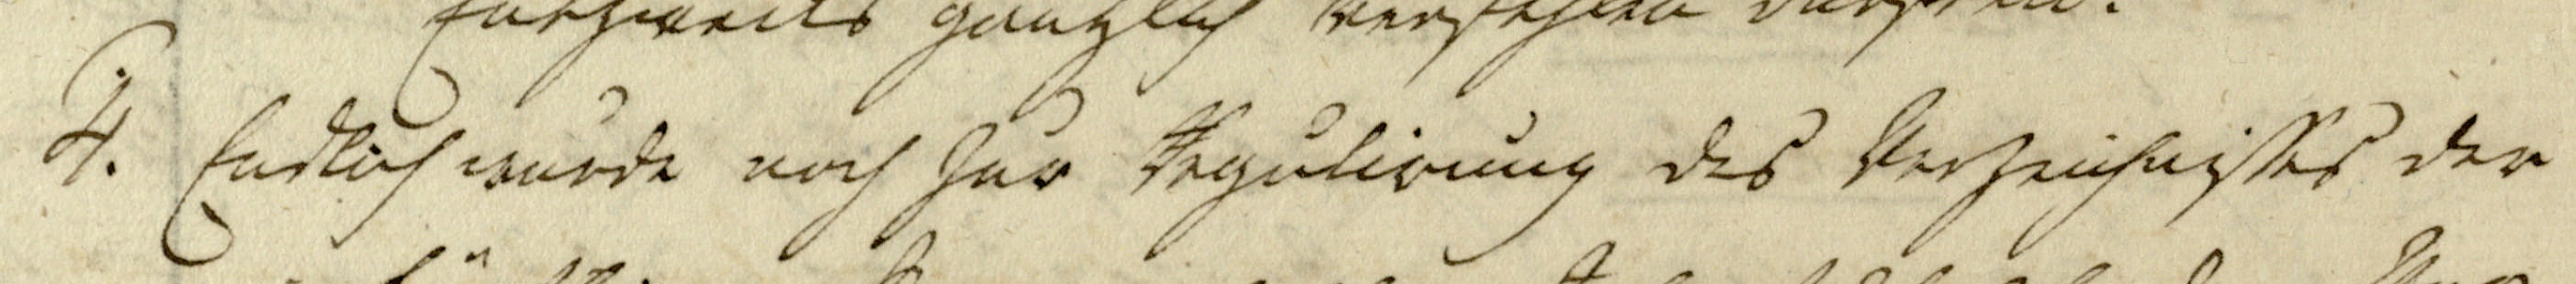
4. Endlich wurde noch zur Regulirung des Verzeichnisses der
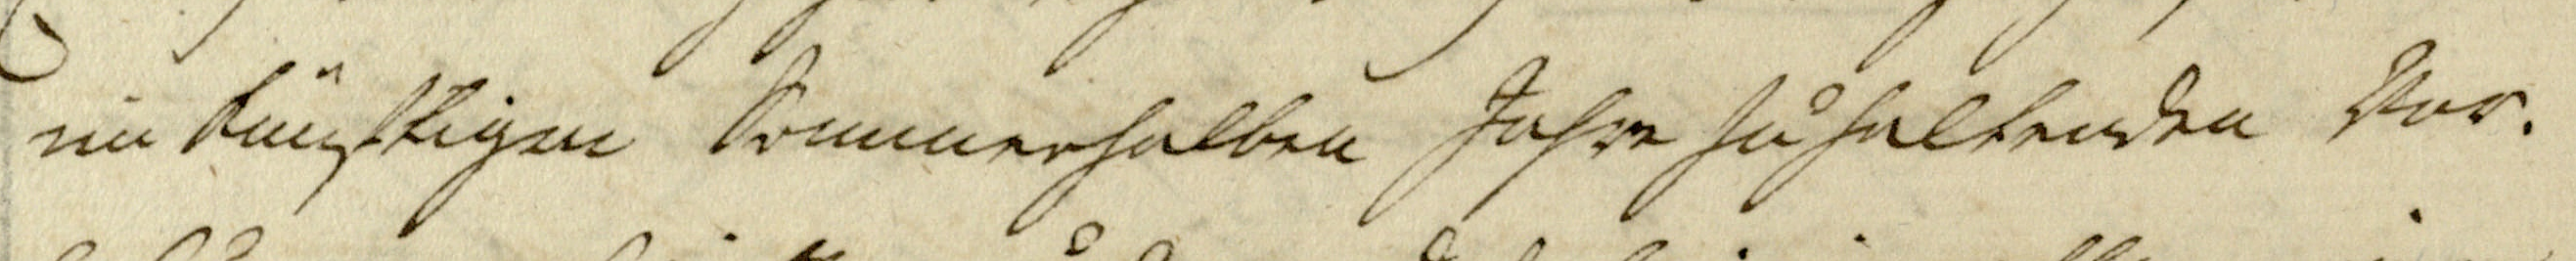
im künftigen Sommerhalben Jahre zu haltenden Vor¬
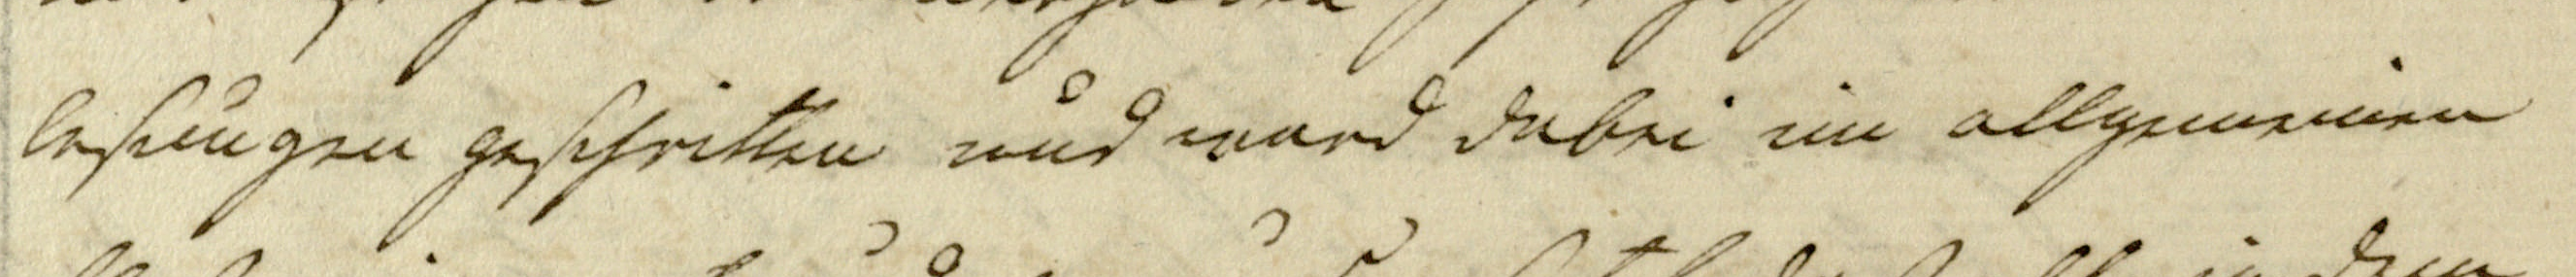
lesungen geschritten und ward dabei im allgemeinen
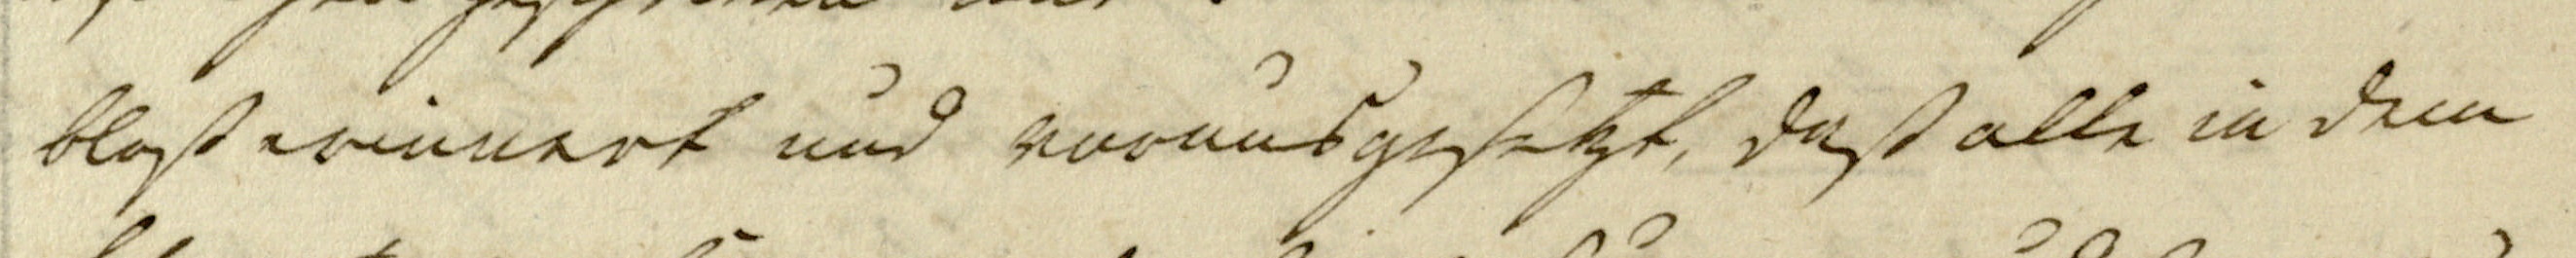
bloß erinnert und vorausgesetzt, daß alle in dem
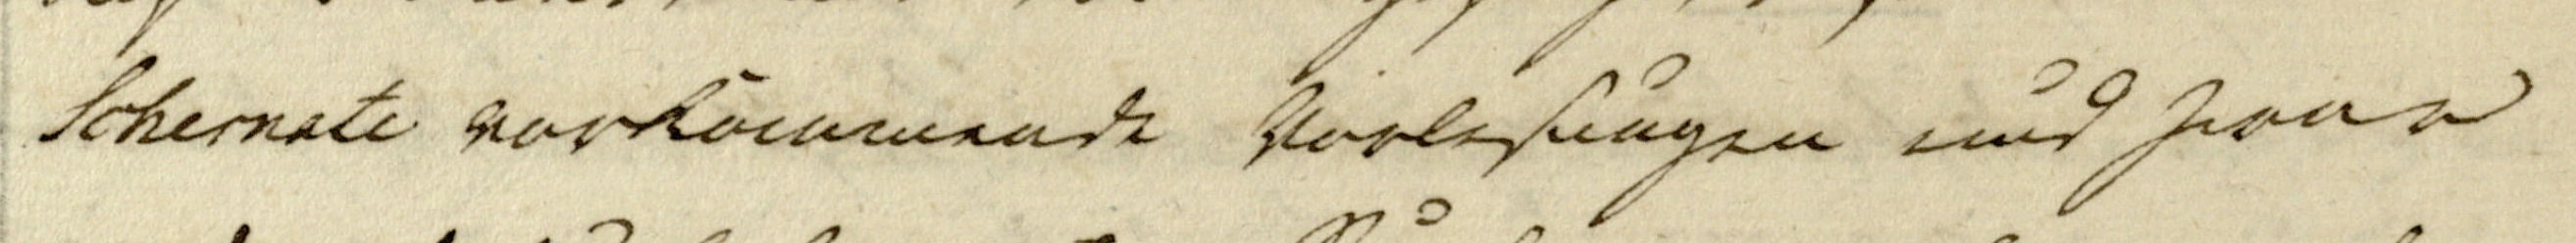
Schemati vorkommende Vorlesungen und zwar
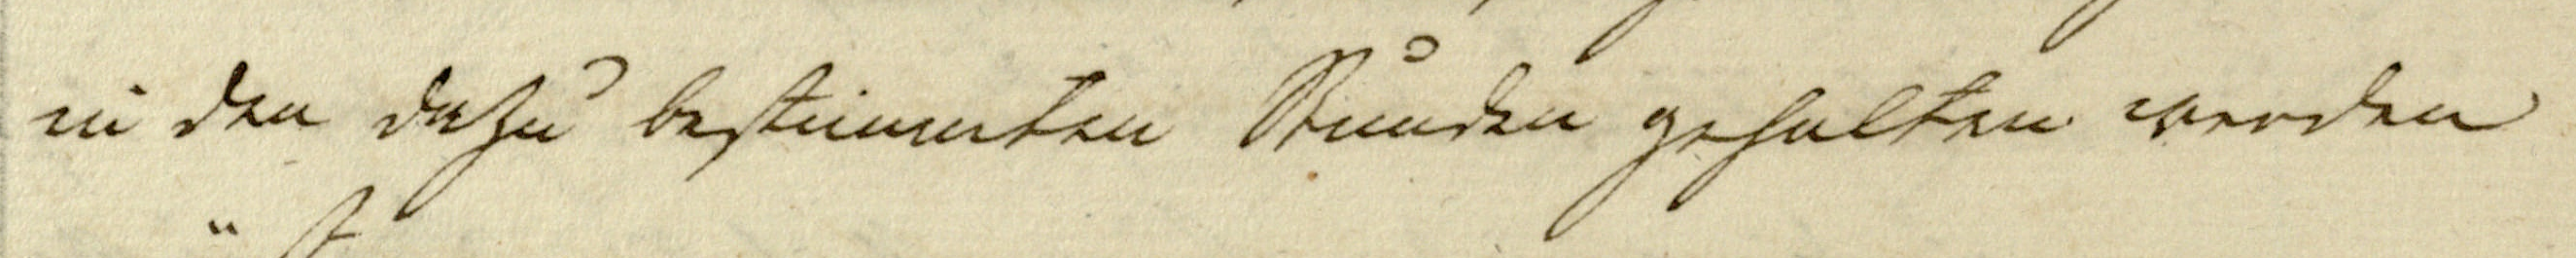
in den dazu bestimmten Stunden gehalten werden
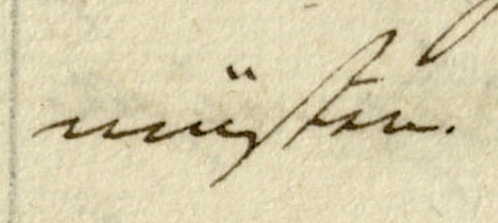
müsten
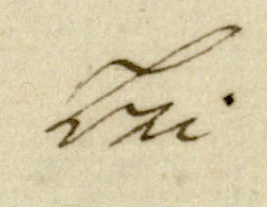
Bei
